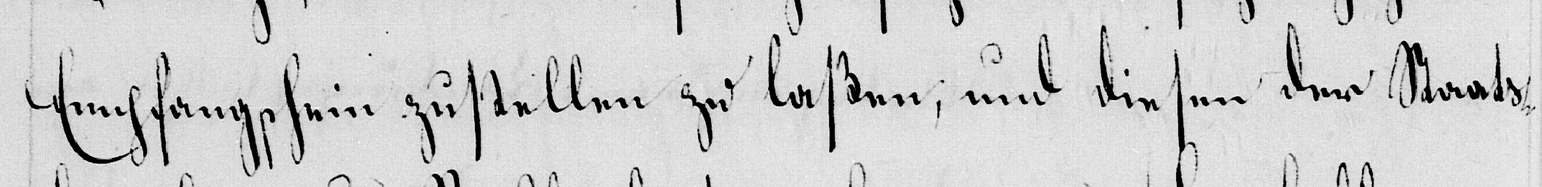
Empfangsschein zustellen zu laßen, und diesen der Staats¬
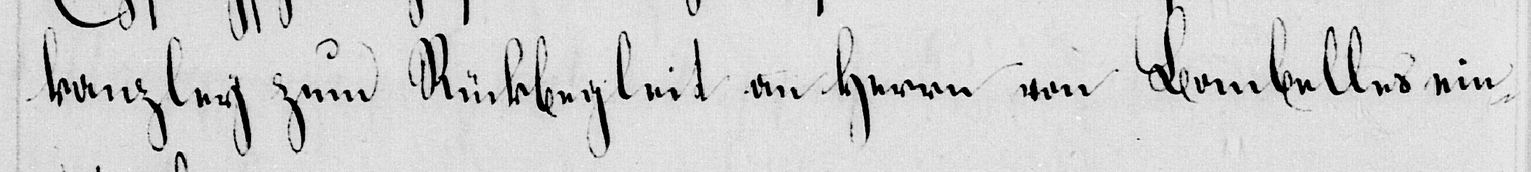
kanzley zum Rückbegleit an Herrn von Bombelles ein¬
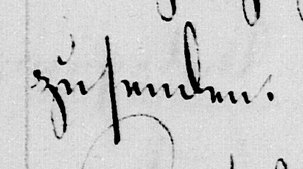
zusenden.
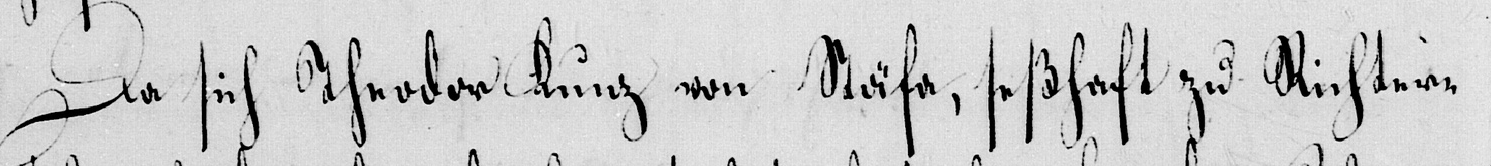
Da sich Theodor Kunz von Stäfa, seßhaft zu Richter¬
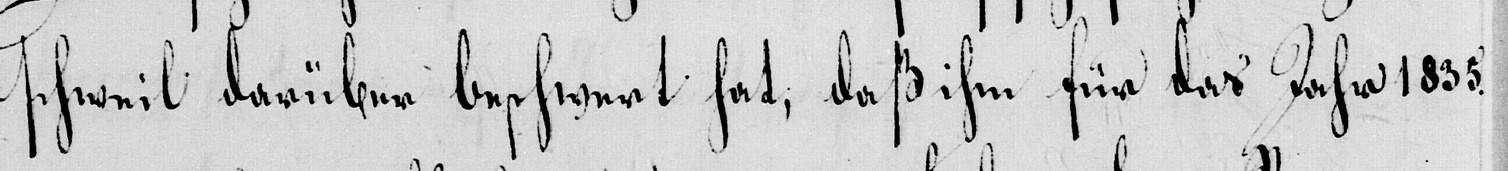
schweil darüber beschwert hat, daß ihm für das Jahr 1835.
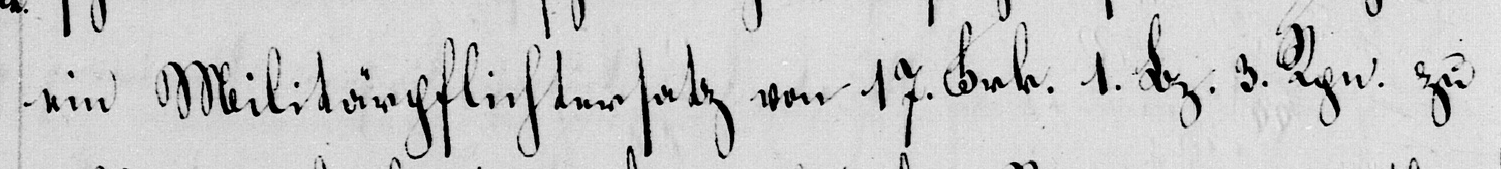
ein Militärpflichtersatz von 17. Frk. 1. Bz. 3. Rpn. zu
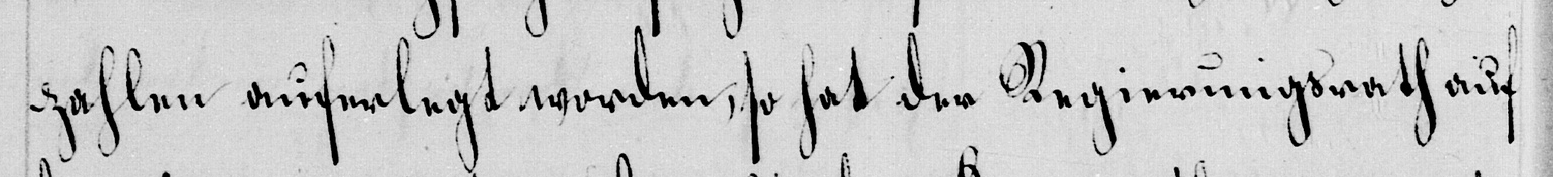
zahlen auferlegt worden, so hat der Regierungsrath auf
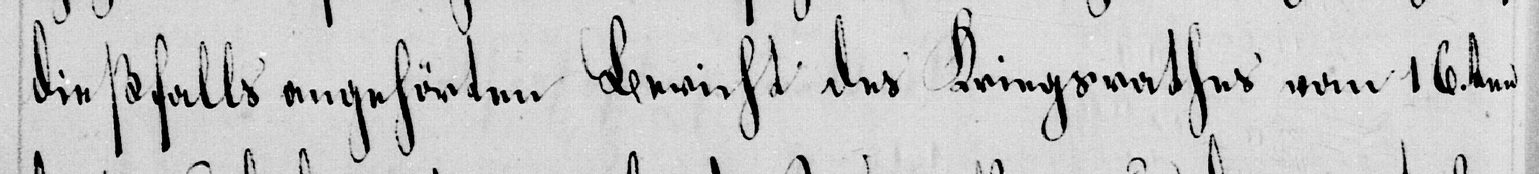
dießfalls angehörten Bericht des Kriegsrathes vom 16.ten
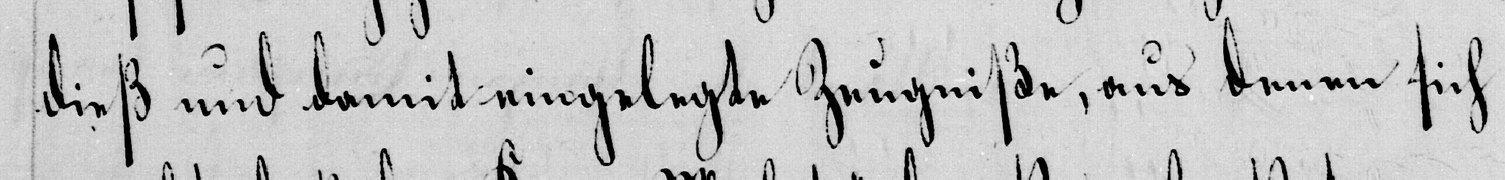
dieß und damit eingelegte Zeugniße, aus denen sich
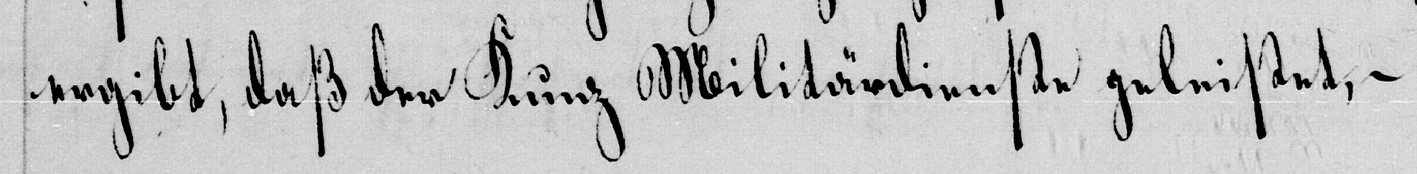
ergibt, daß der Kunz Militärdienst geleistet, –
